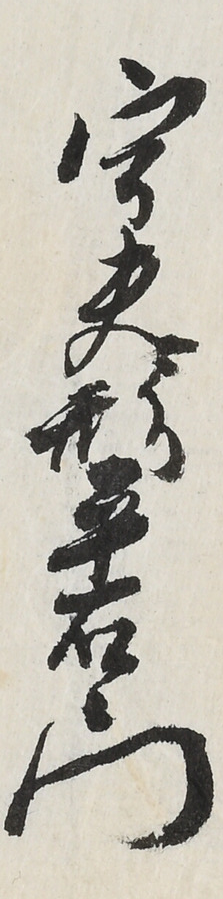宇夫形平右衛門
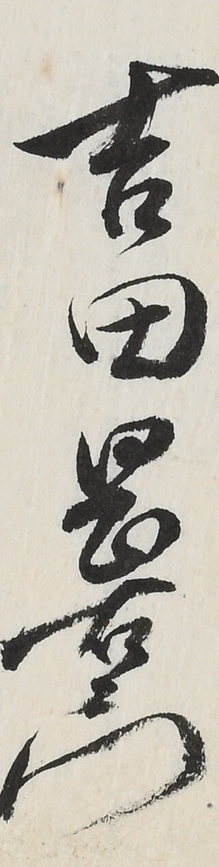吉田岡右衛門
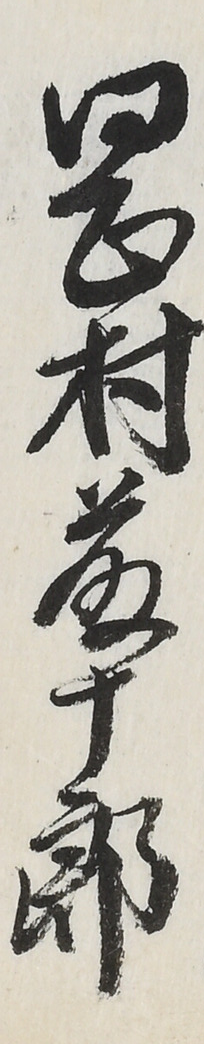岡村藤十郎
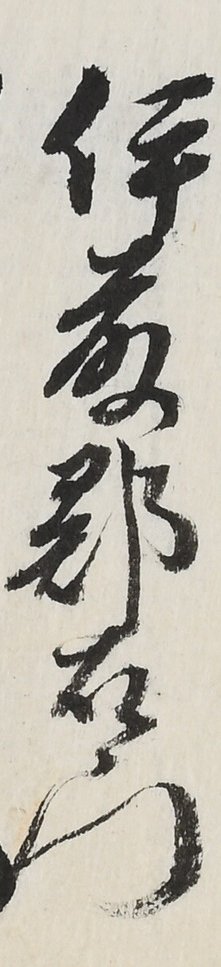伊藤郡右衛門
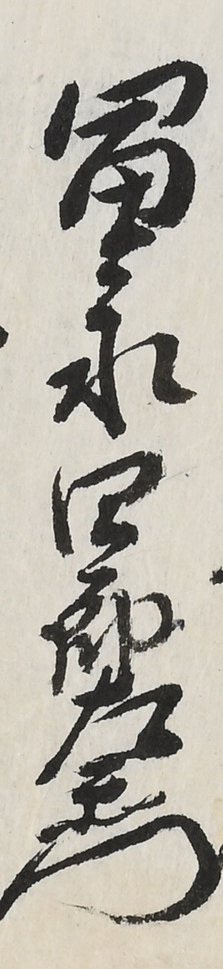冨永四郎左衛門
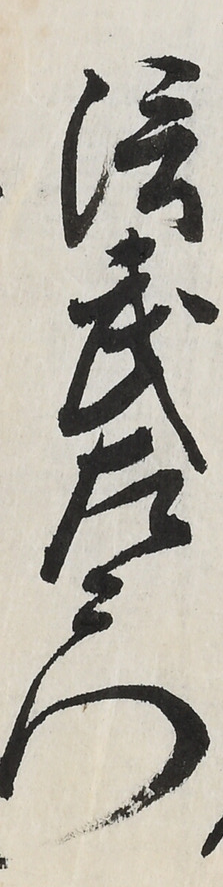浜武左衛門
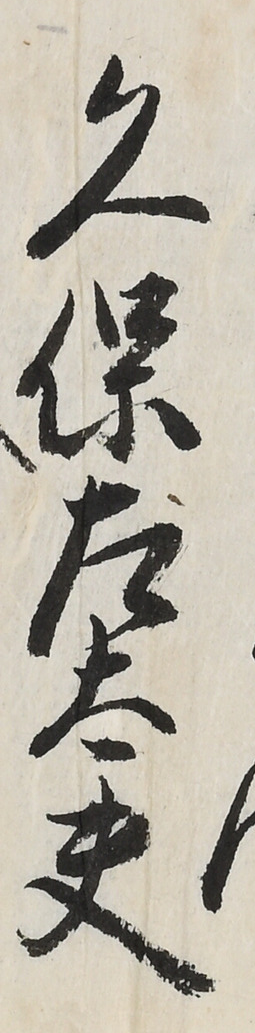久保左太夫
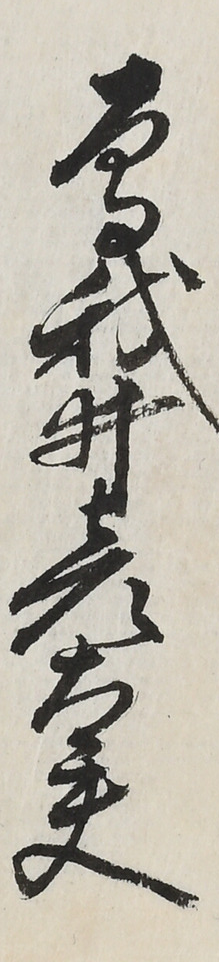鳥我井彦太夫
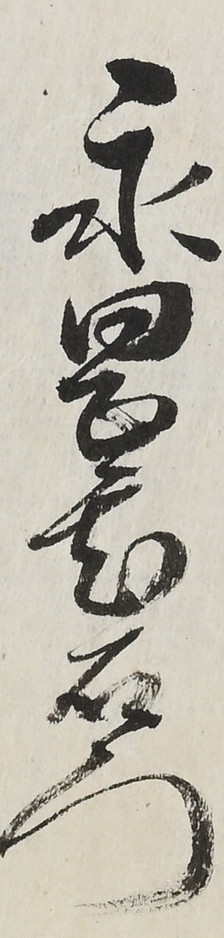永岡甚右衛門
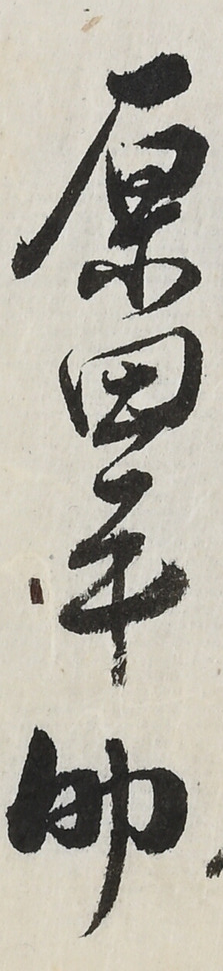原田平助
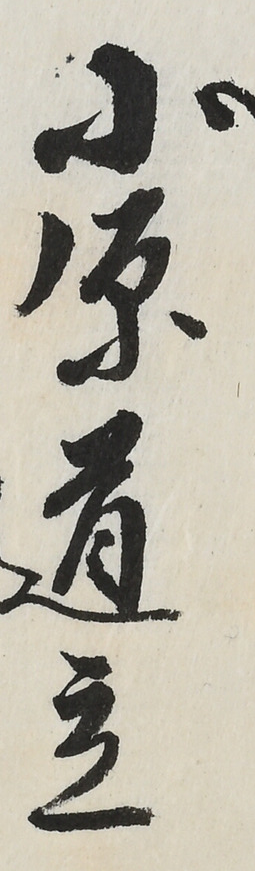北原道立
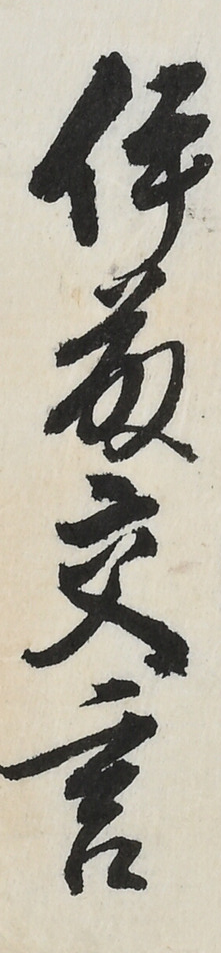伊藤交言

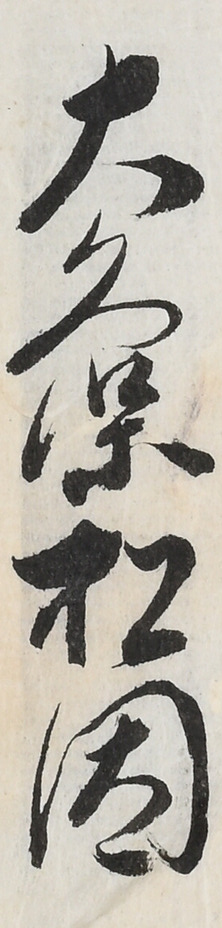大久保松因
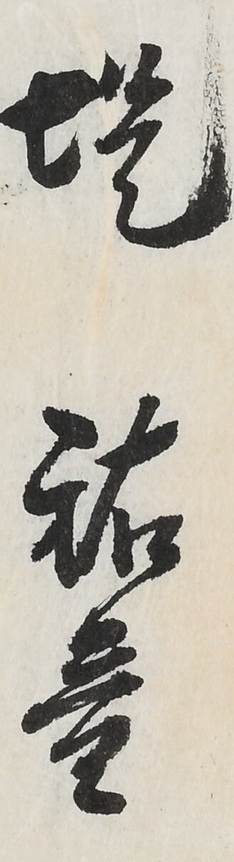堤祐童
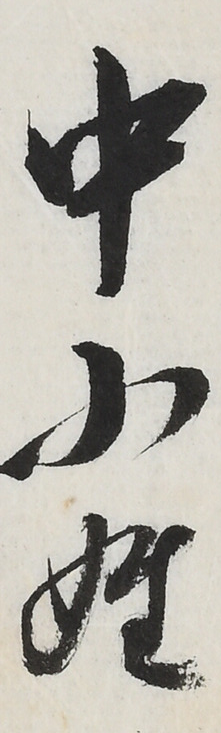中小姓
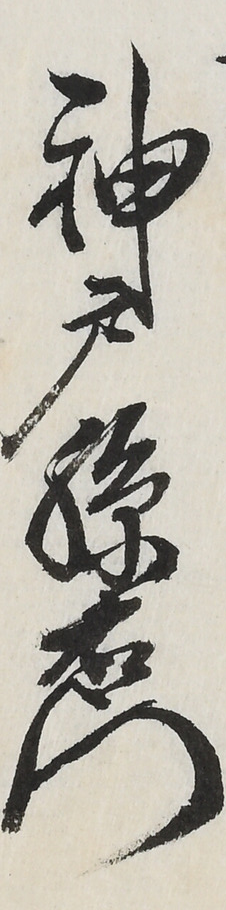神戸孫右衛門
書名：高遠江戸徒以上之面々
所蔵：伊那市立高遠町図書館・合同会社AMANE
